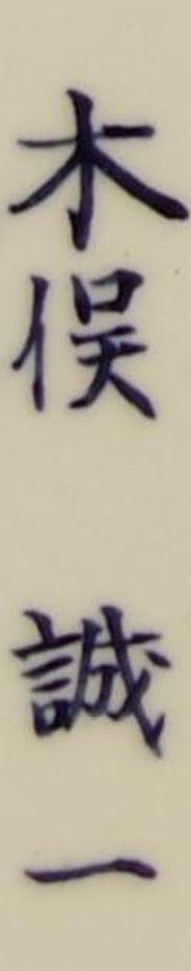木俣誠一
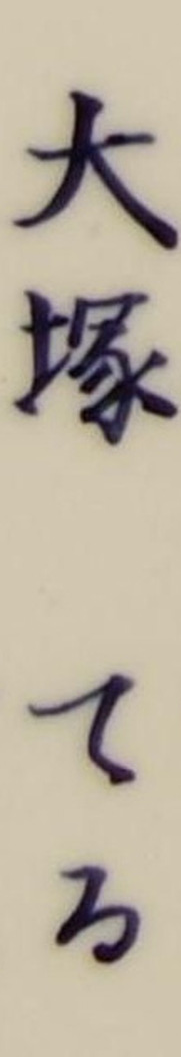大塚てる
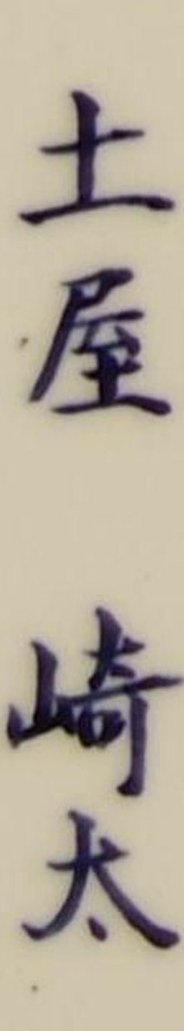土屋崎太
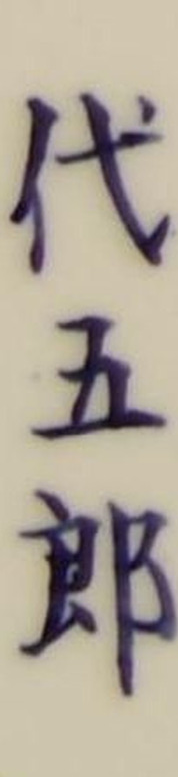代五郎
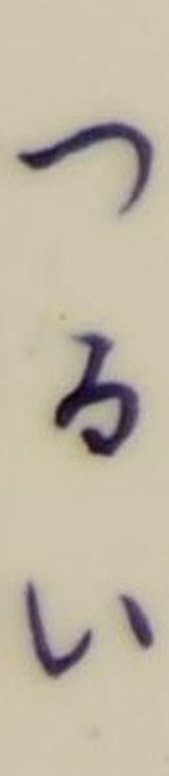つるい

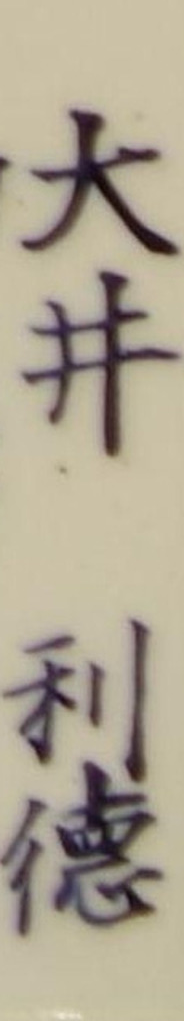大井利徳
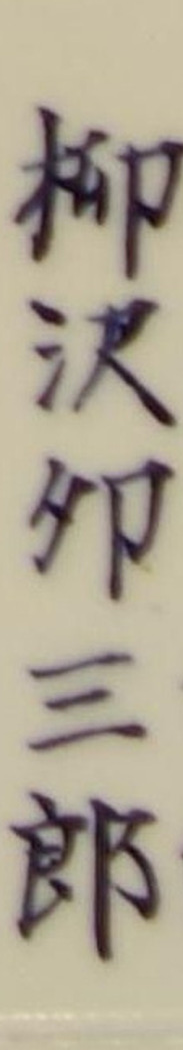柳沢卯三郎
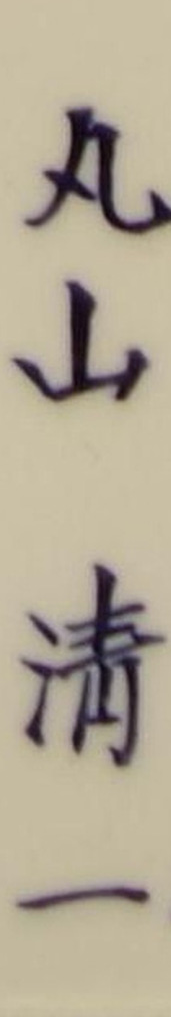丸山清一
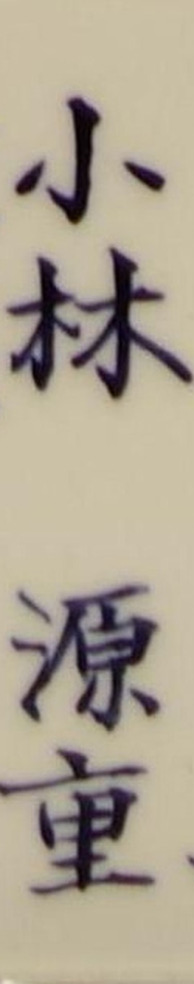小林源重
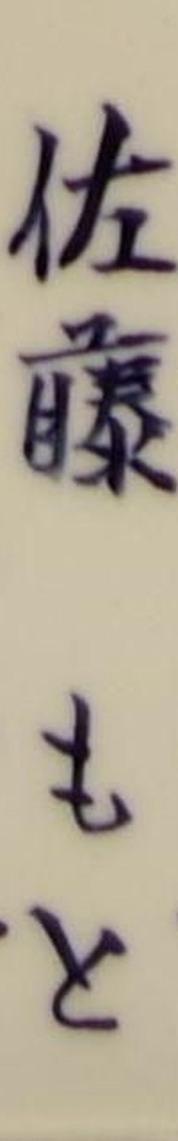佐藤もと
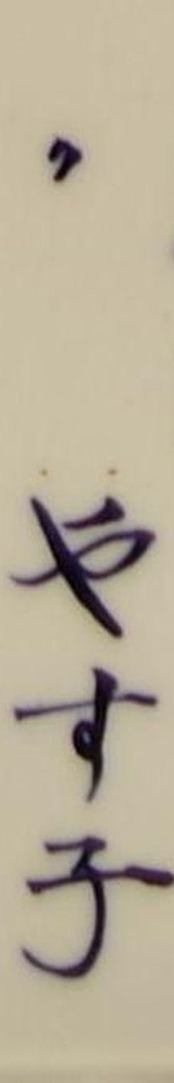やす子
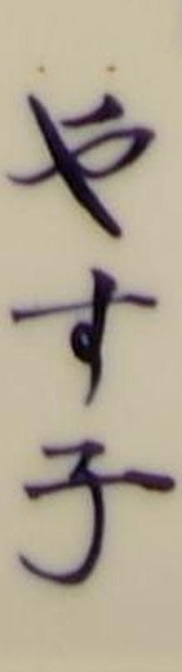やす子
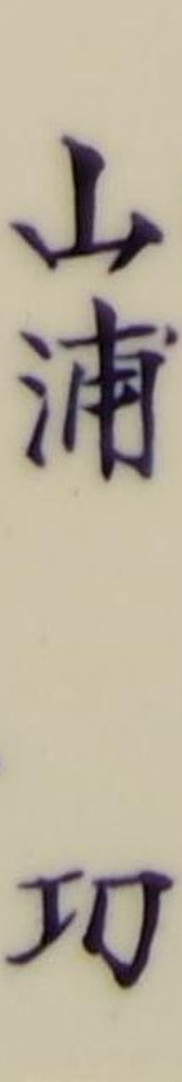山浦功
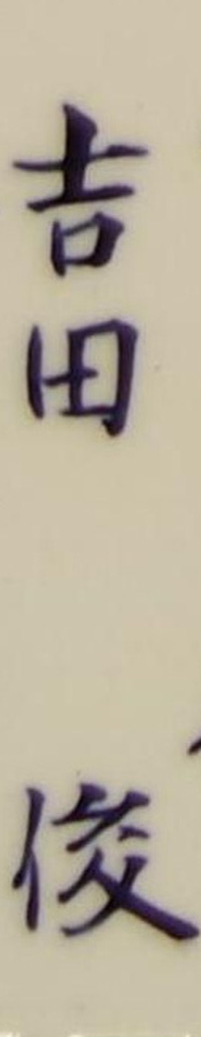吉田俊
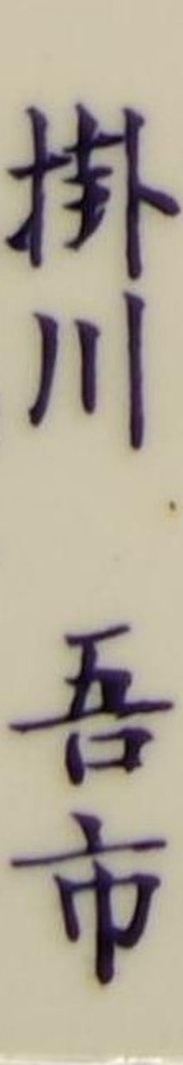掛川吾市
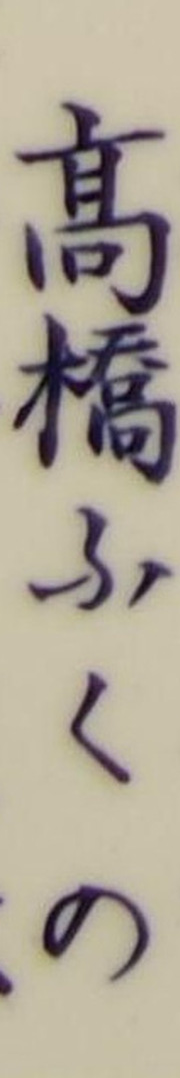高橋ふくの
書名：A~D
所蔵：koyasan kongobuji
